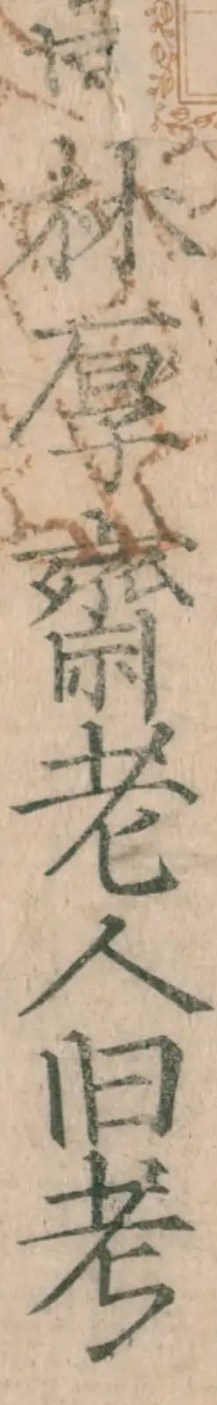高林厚齋老人旧考
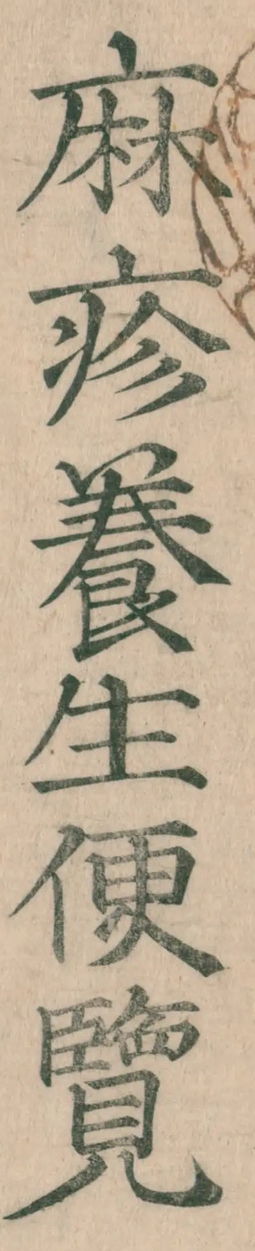麻疹養生便覧

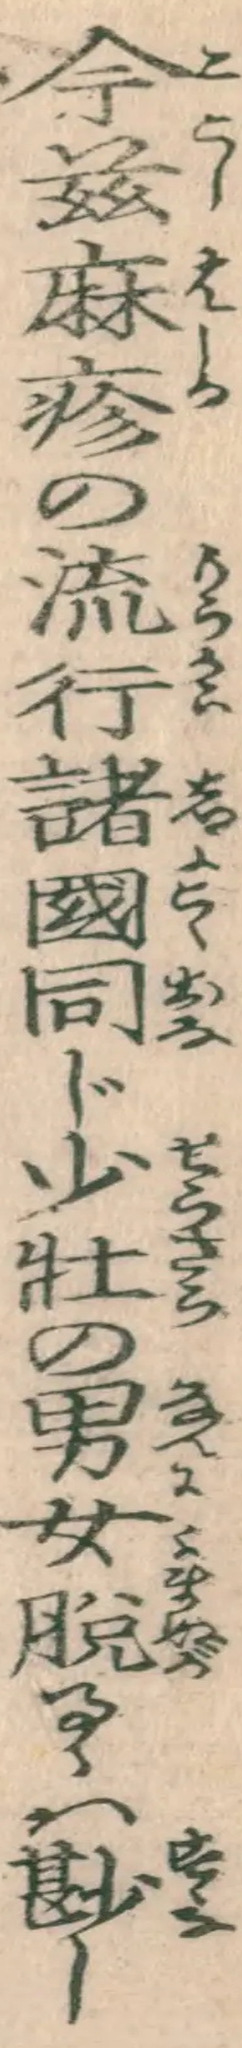今茲麻疹の流行諸国同じ少壮の男女脱るゝは尠し
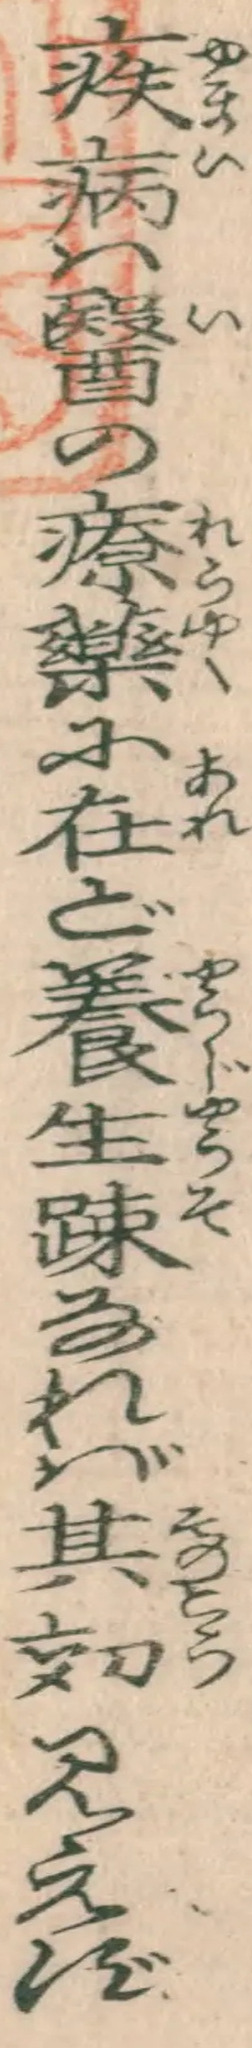疾病は医の療薬に在ど養生疎なれば其効見えず
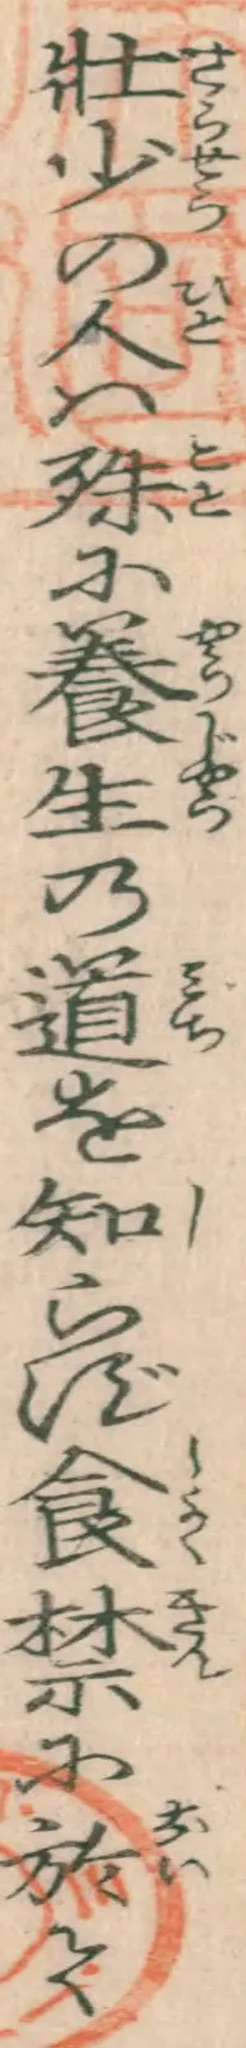壮少の人は殊に養生の道を知らず食禁に於て
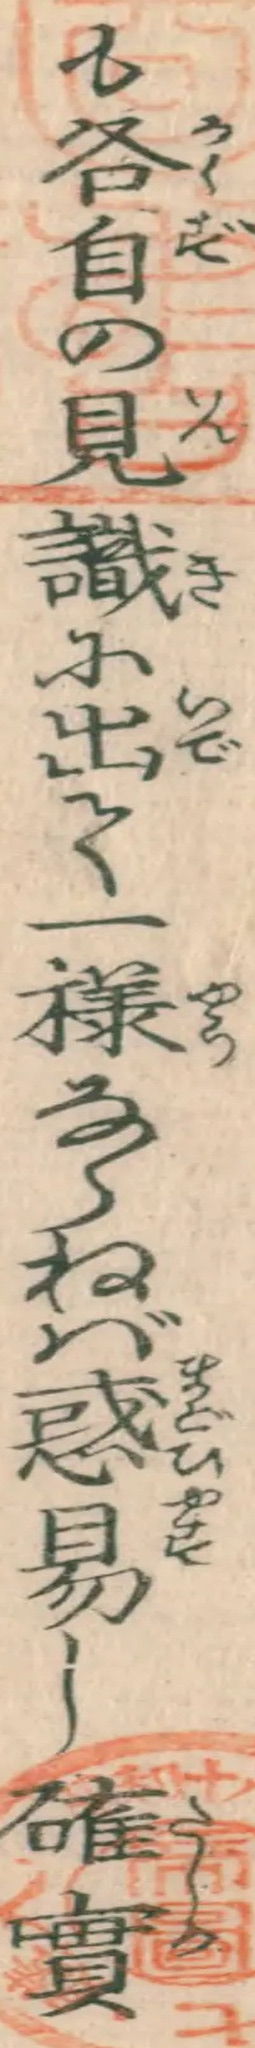も各自の見識に出て一様ならねば惑易し確実
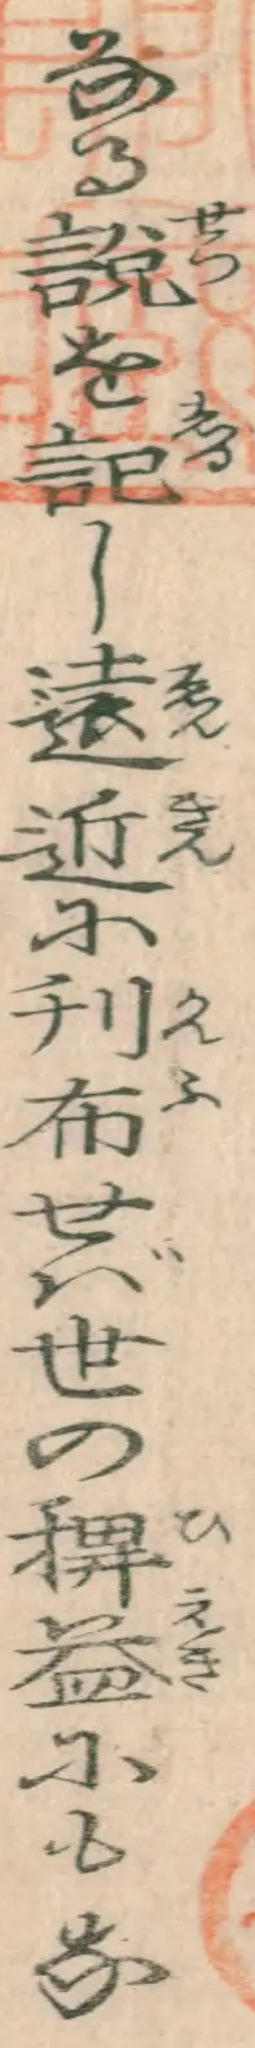なる説を記し遠近に刊布せば世の稗益にもな
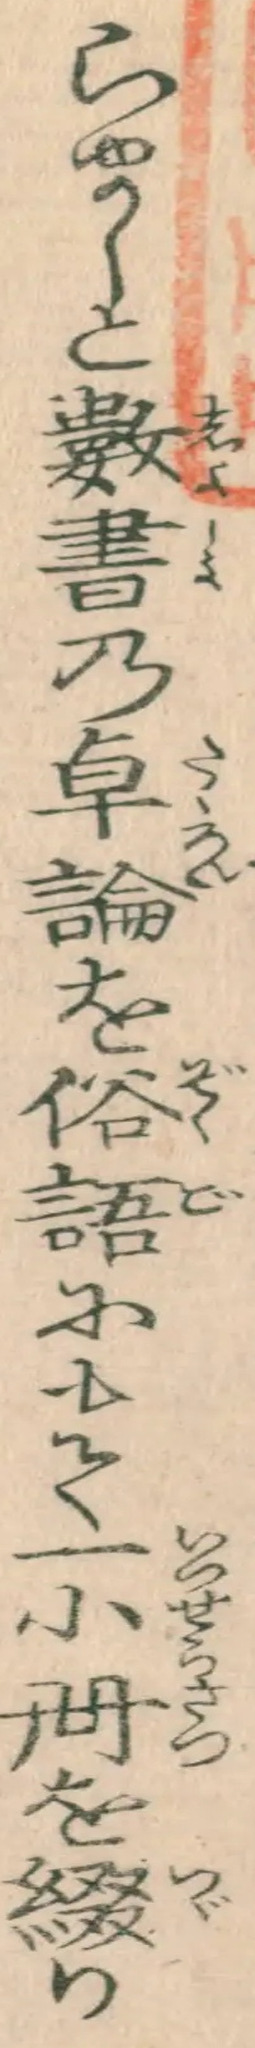らましと数書の卓論を俗語にもて一小冊を綴り
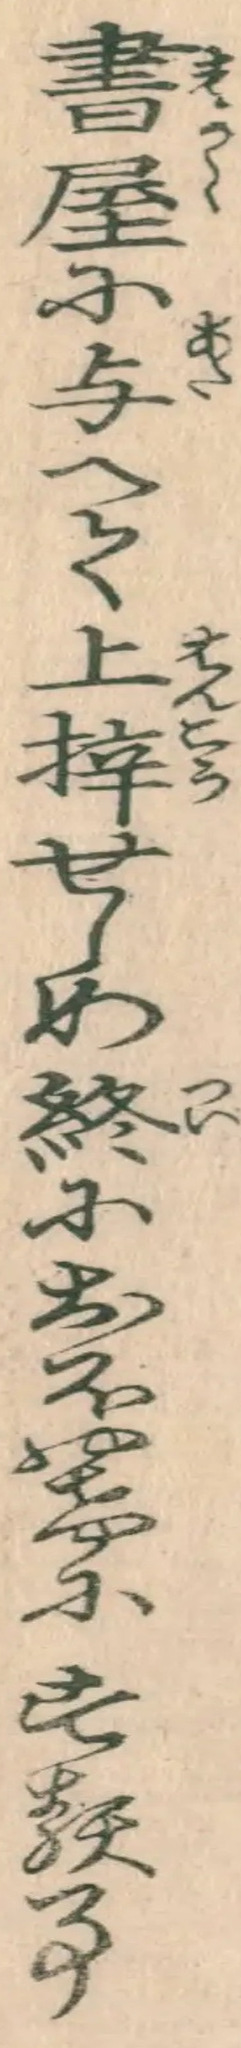書屋に与へて上梓せしめ終におほやけにする事
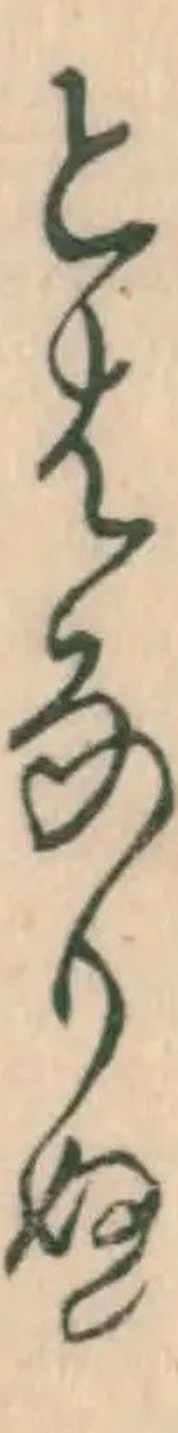とはなりぬ
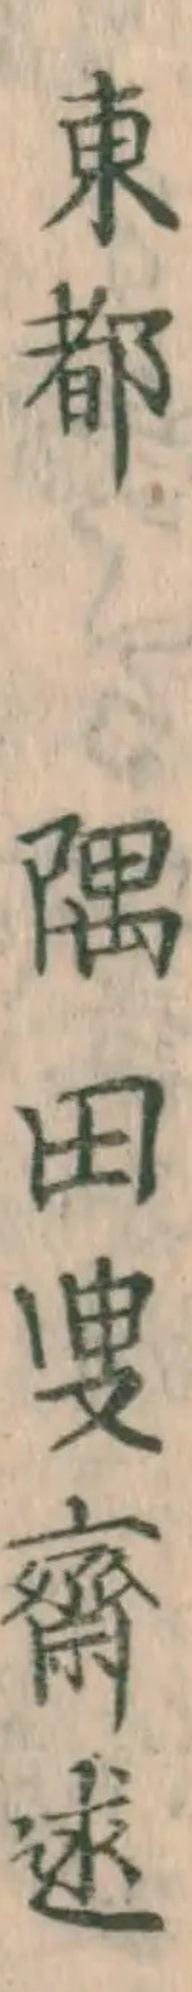東都隅田叟斎述
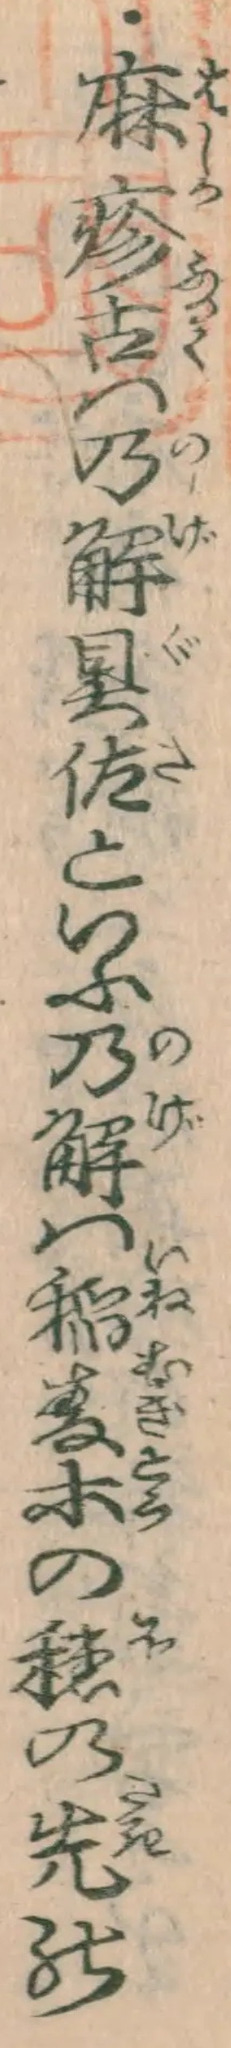・麻疹古は乃解具佐といふ乃解は稲麦等の穂の先の
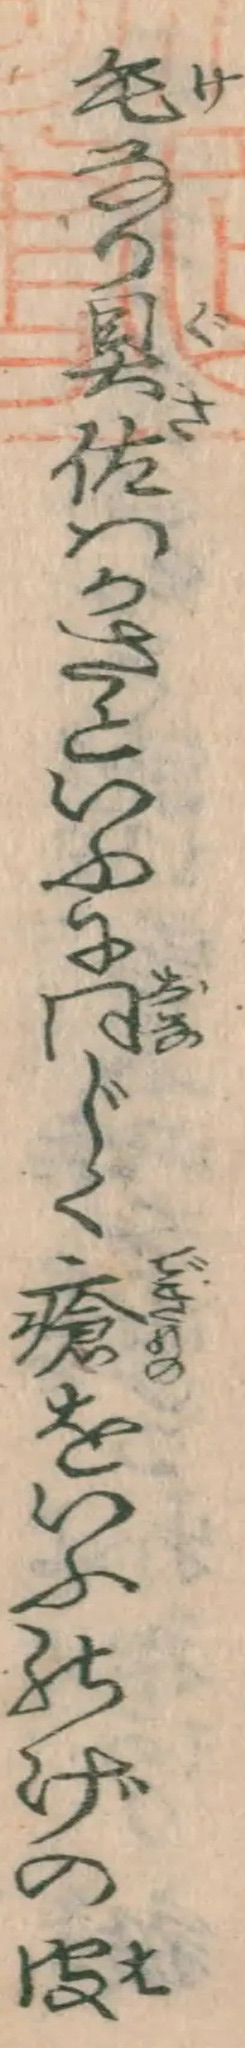毛なり具佐はかさといふに同じく瘡をいふのげの皮
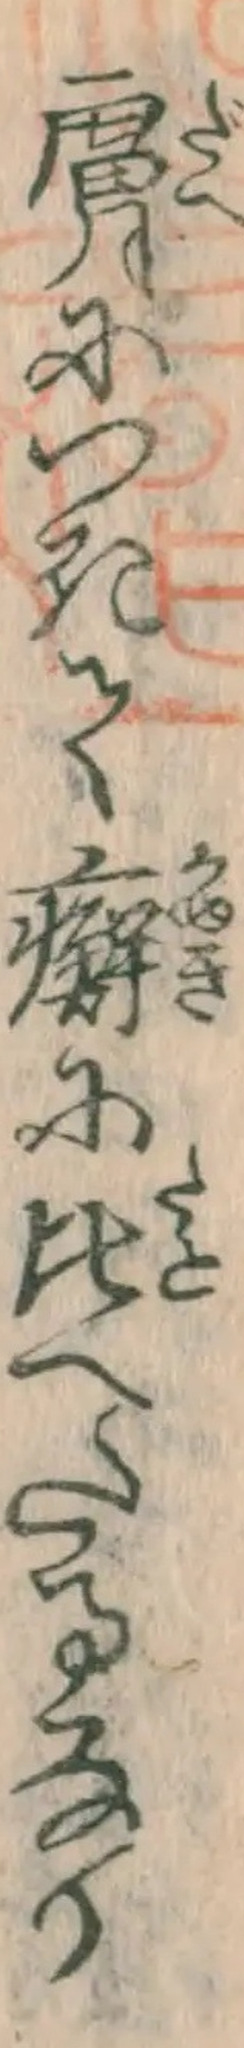膚につきて癬に比へたるなり
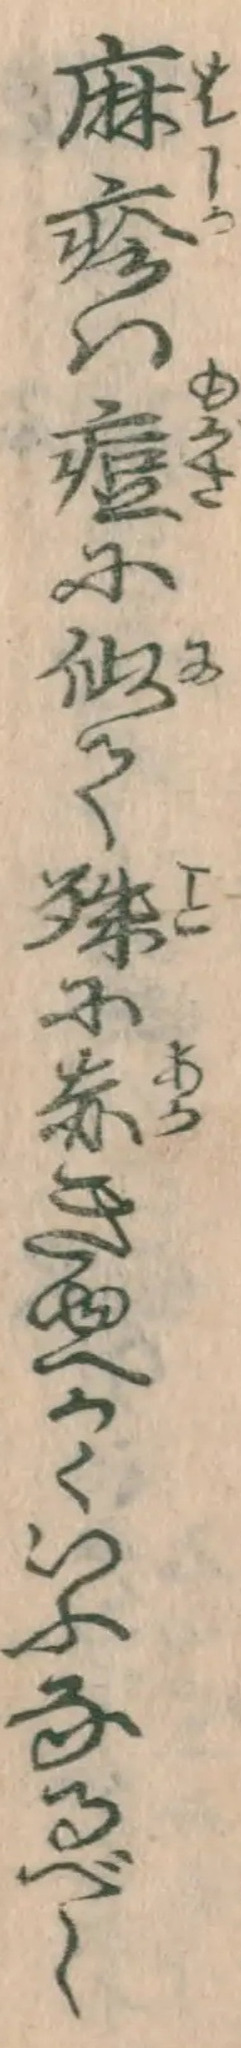麻疹は痘に似て殊に赤きゆへかくいふなるべし
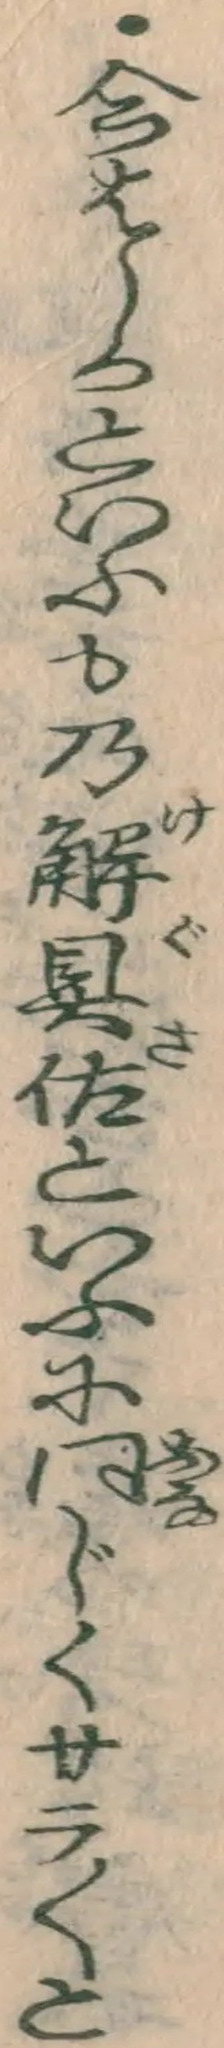・今はしかといふも乃解具佐といふに同じくサラ〳〵と
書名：麻疹養生鑑
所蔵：国立国会図書館 National Diet Library, JAPAN
